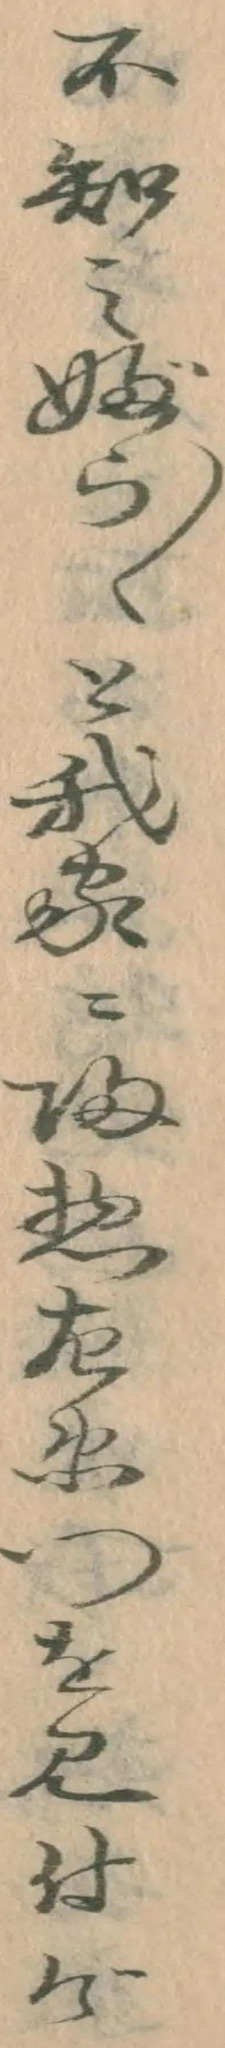不知之ぶら〳〵と我家に帰惣左衛門を見付げ
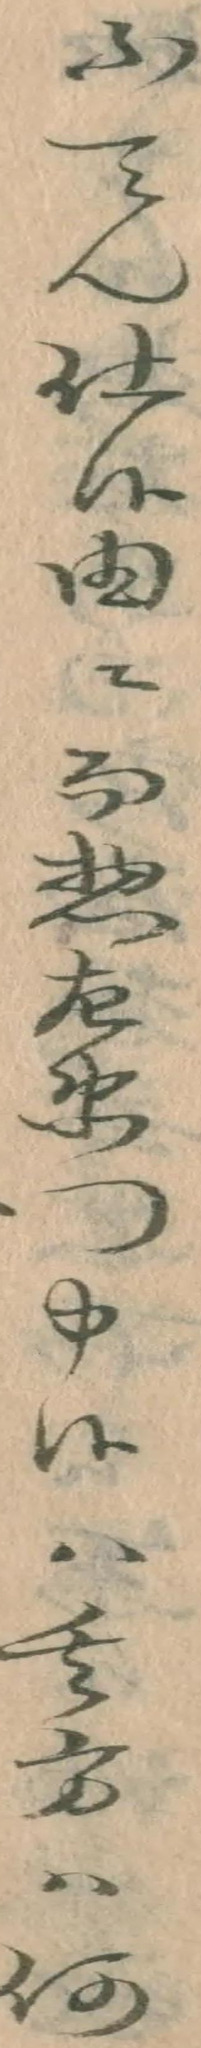ふてん仕候由に而惣左衛門申候は其方は何
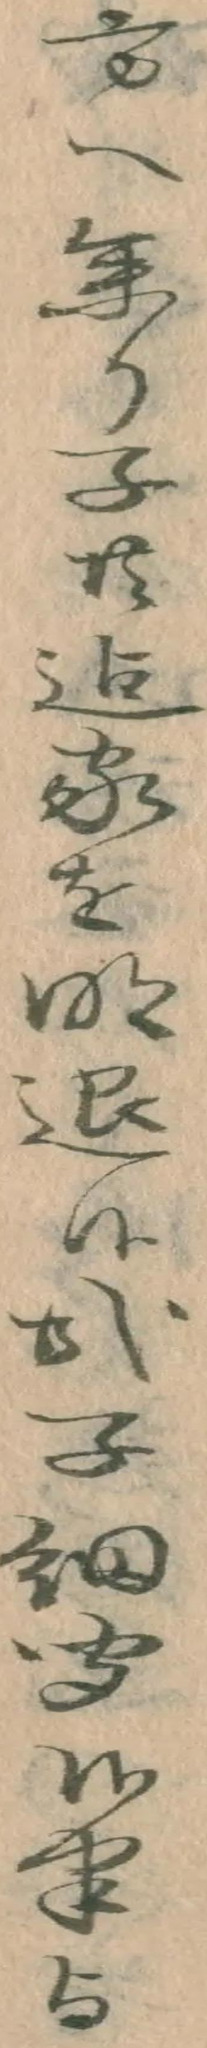方へ参り子共迄家を明退候哉子細聞候半与
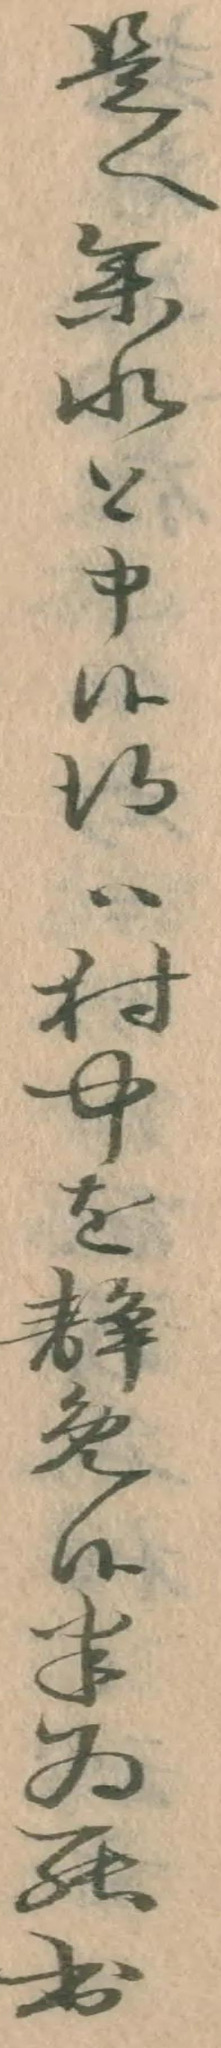是へ参れと申候得は村中を静め候半為罷出
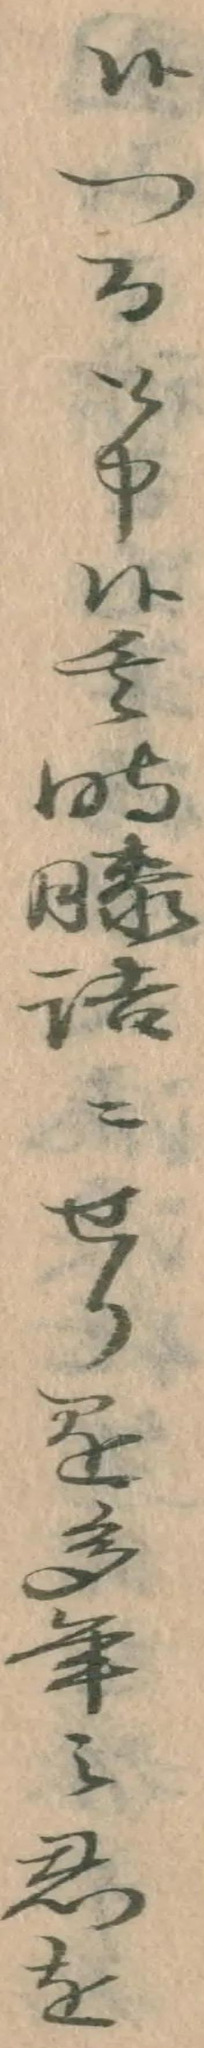候つると申候其時膝詰にせり懸多年之恩を
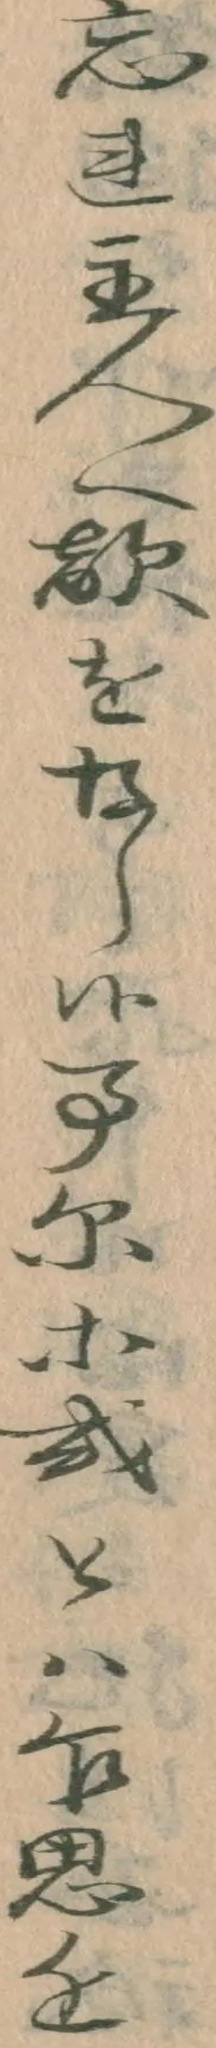忘れ主人へ敵をなし候事尓等哉とは乍思近
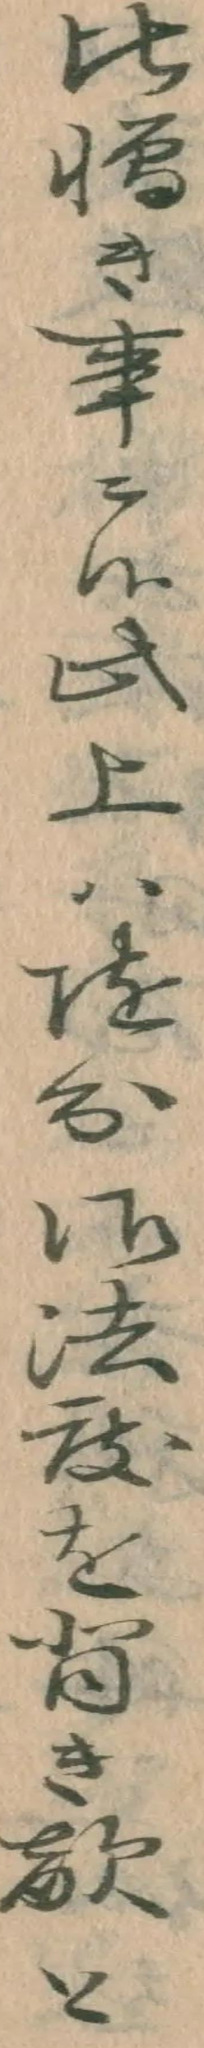比憎き事に候此上は随分御法度を背き敵と
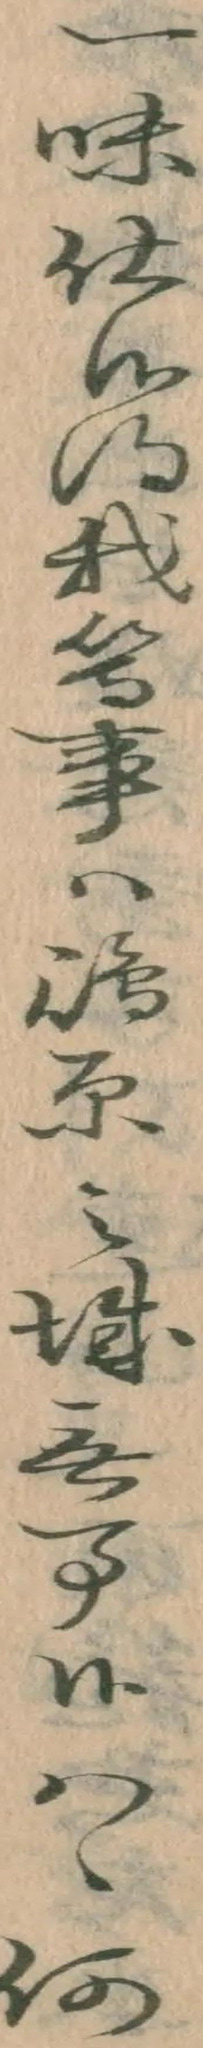一味仕候得我等事は島原之城無事候はゝ何
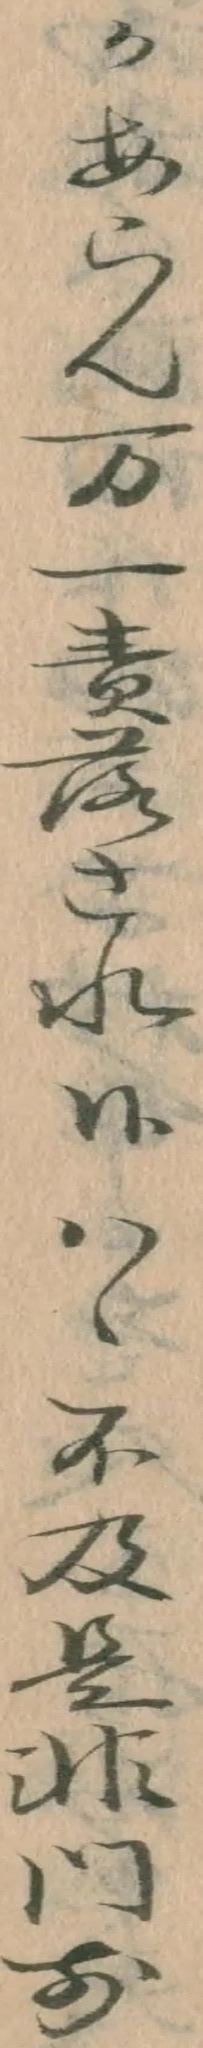かあらん万一責落され候はゝ不及是非門前
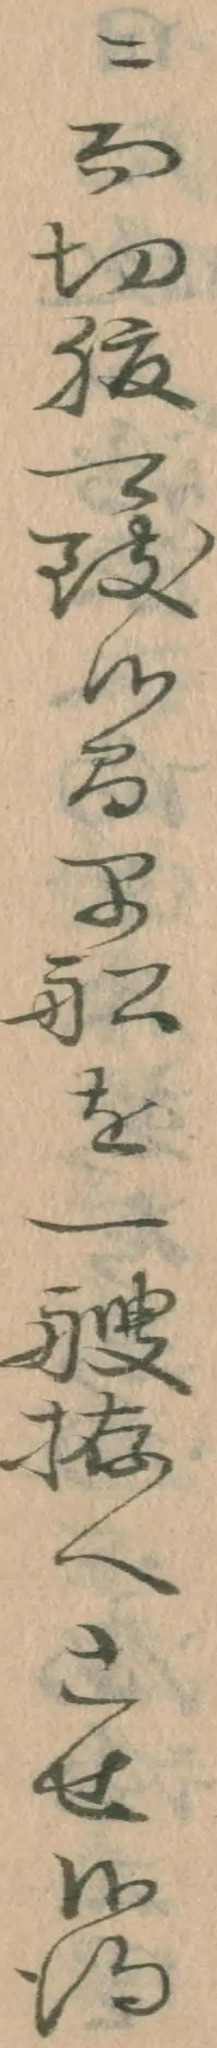に而切腹可致候間早船を一艘拵へさせ候得
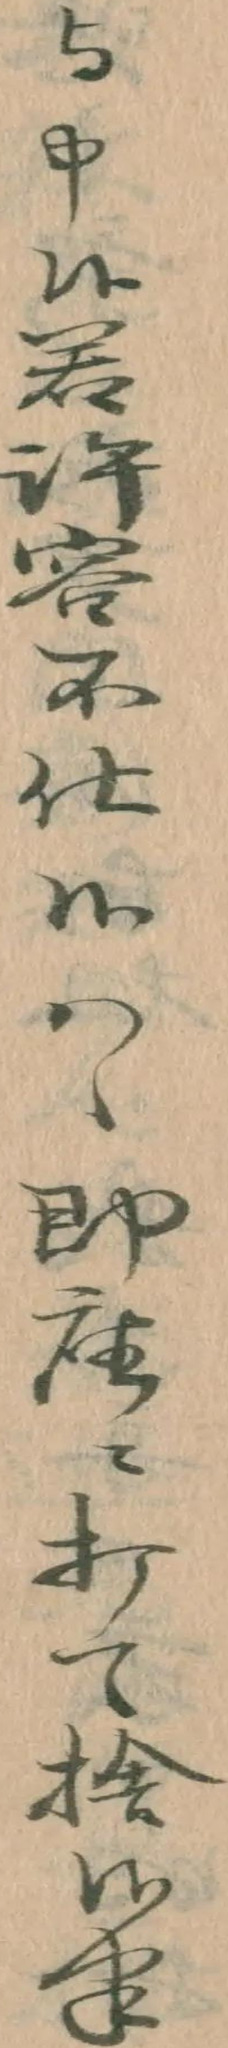与申候若許容不仕候はゝ即座に打て捨候半
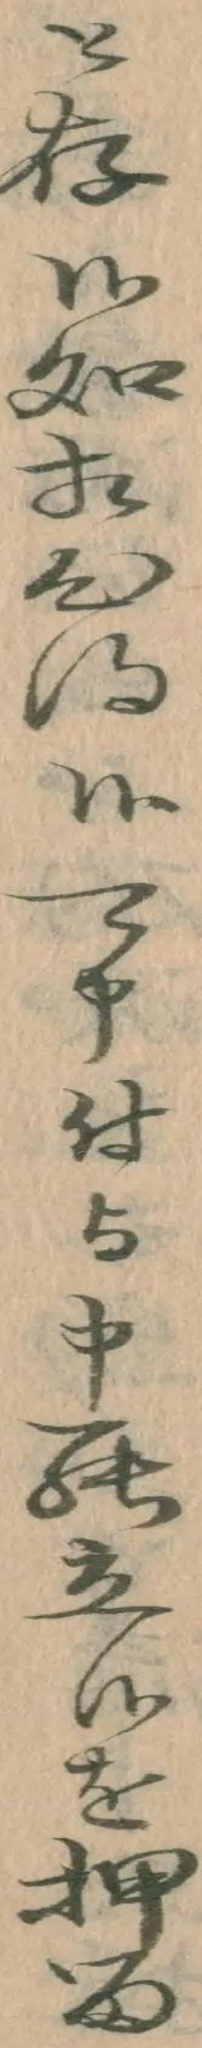と存候処相心得候可申付与申罷立候を押留
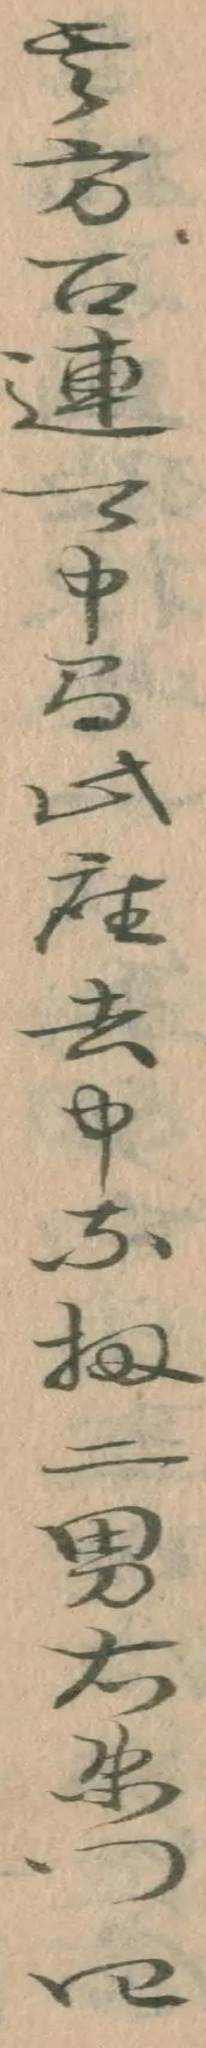其方召連可申間此座去申な扨二男右衛門四
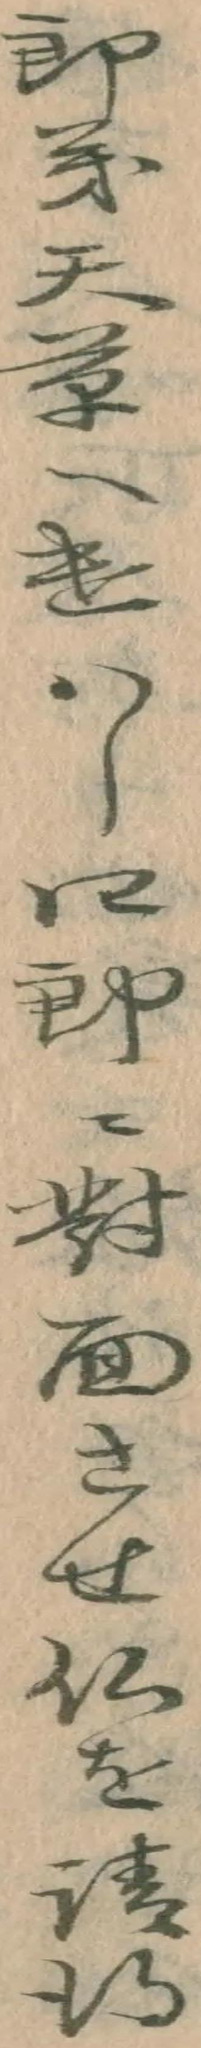郎義天草へ遣はし四郎に対面させ仏を請得
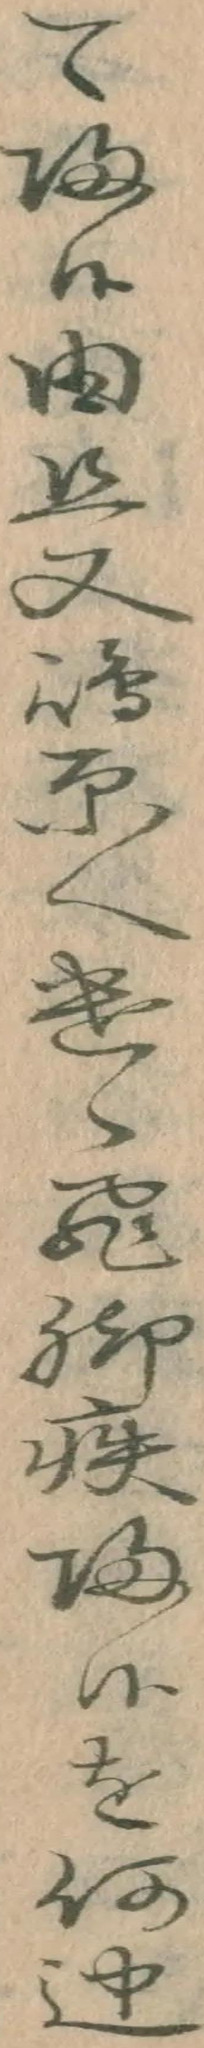て帰候由且又島原へ遣候飛脚疾帰候を何迚
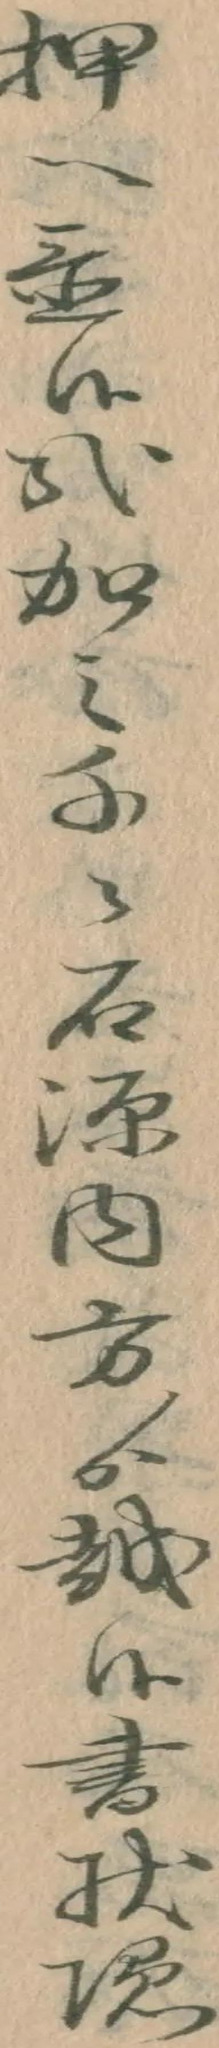押へ置候哉加之千々石源内方ゟ越候書状隠
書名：切支丹御退治記 49巻. [1]
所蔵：国立国会図書館 National Diet Library, JAPAN
